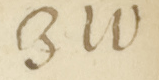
310
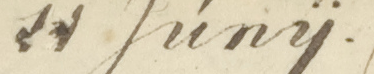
11 Junij.
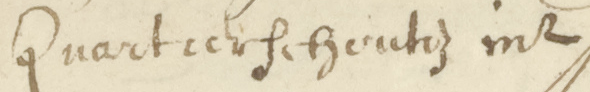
Quartierschouten in
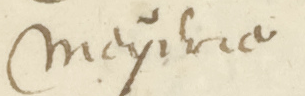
Meijerie
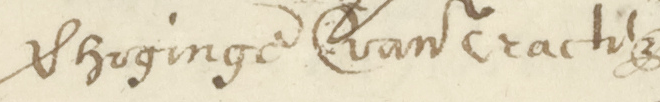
vhoginge van Tracte„
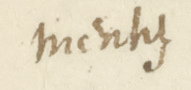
menten.
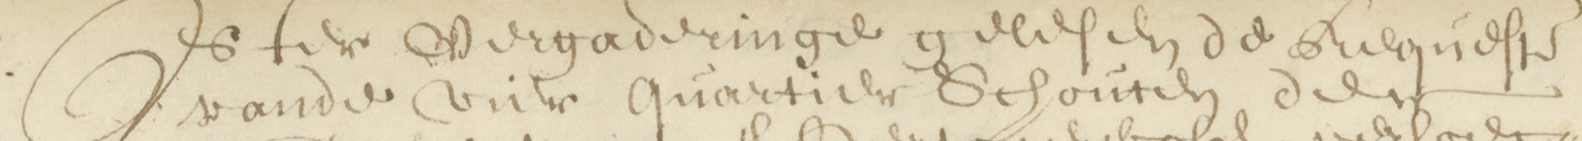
Is ter Vergaderinge gelesen de Requeste
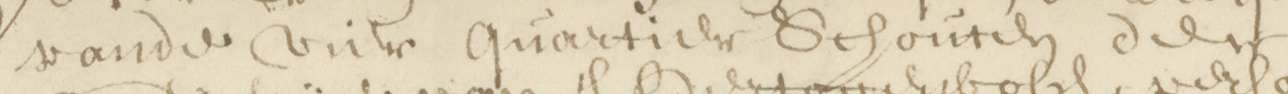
vande vier Quartier Schouten der
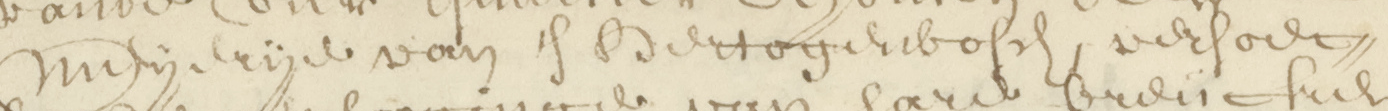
Meijerije van ‛s Hertogenbosch versoec„
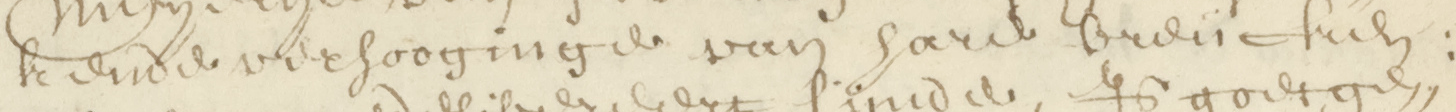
kende verhooginge van hare breucken:
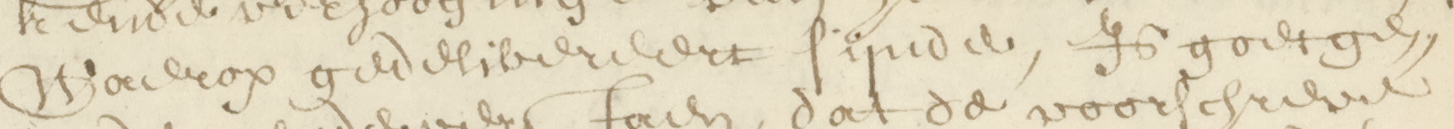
Waerop gedelibereert sijnde, Is goetge,,
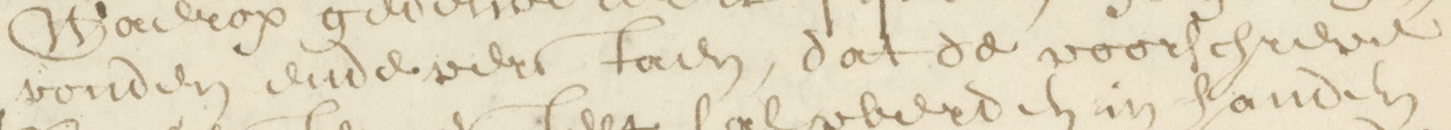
vonden ende verstaen, dat de voorschreve
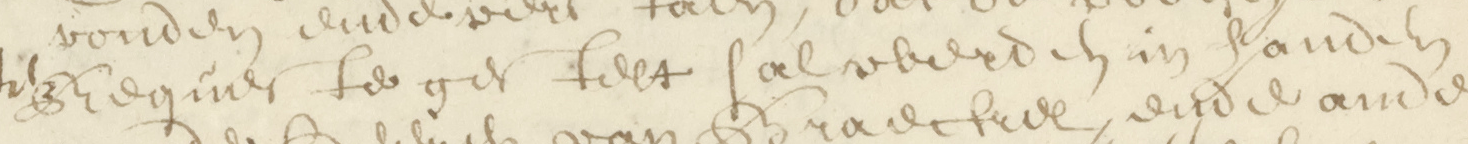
Requeste gestelt sal werden in handen
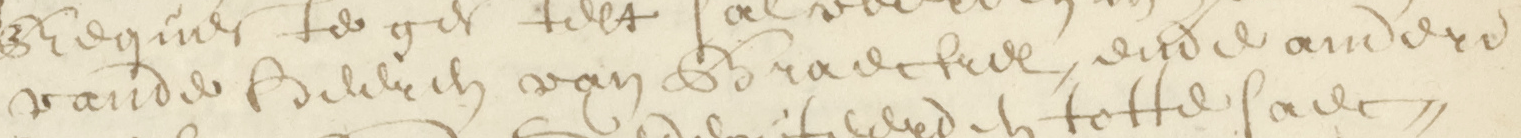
vande Heeren van Braeckel, ende andere
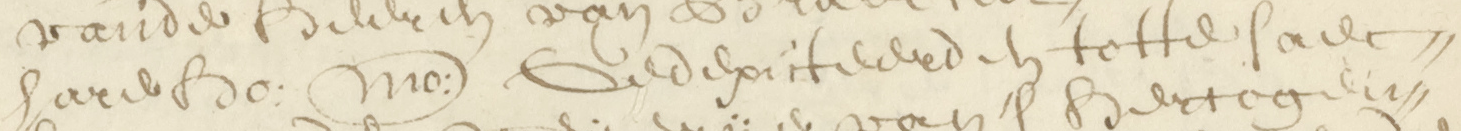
hare Ho:Mo: Gedeputeerden totte saec„
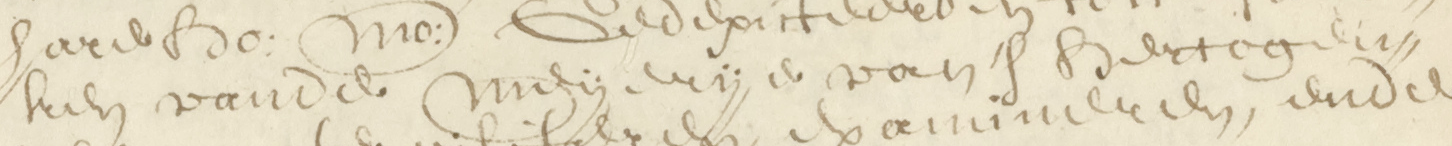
ken vande Meijerije van 's Hertogen,,
